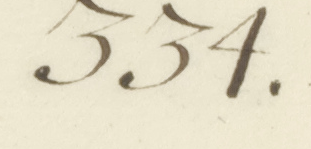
334.
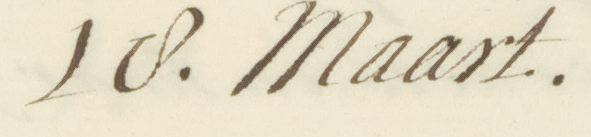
18. Maart.
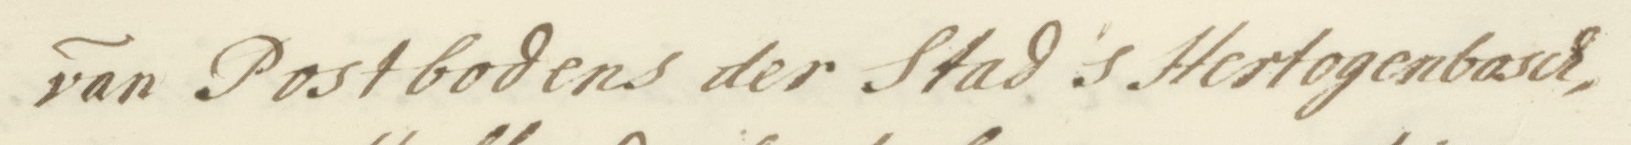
van Postbodens der stad 's Hertogenbosch,
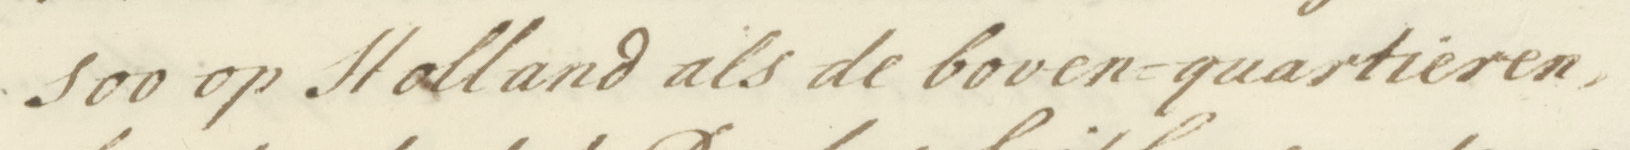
soo op Holland als de boven-quartieren,
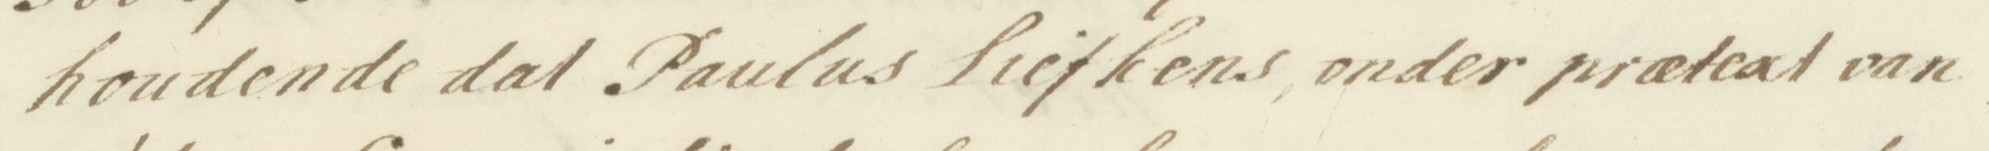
houdende dat Paulus Liefkens onder prætext van
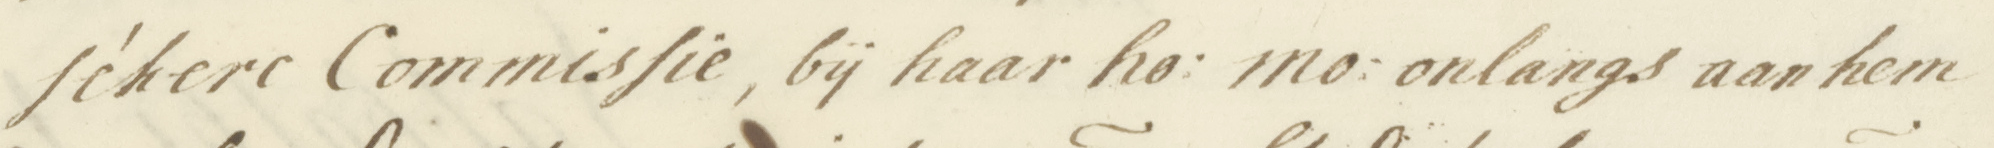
sekere commissie bij haar ho:mo: onlangs aan hem
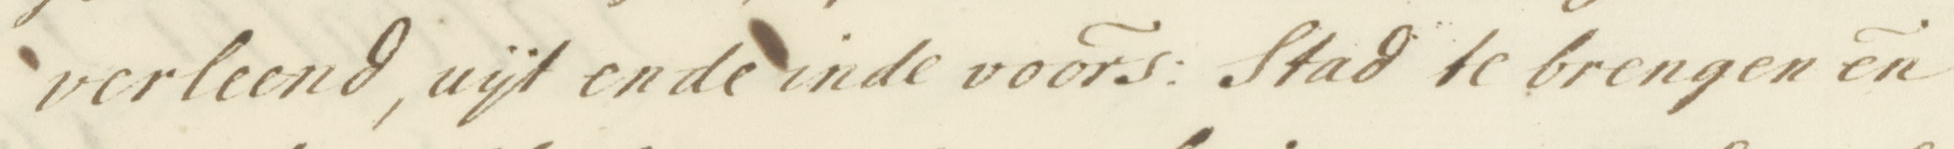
verleend, uijt ende inde voors: stad te brengen en
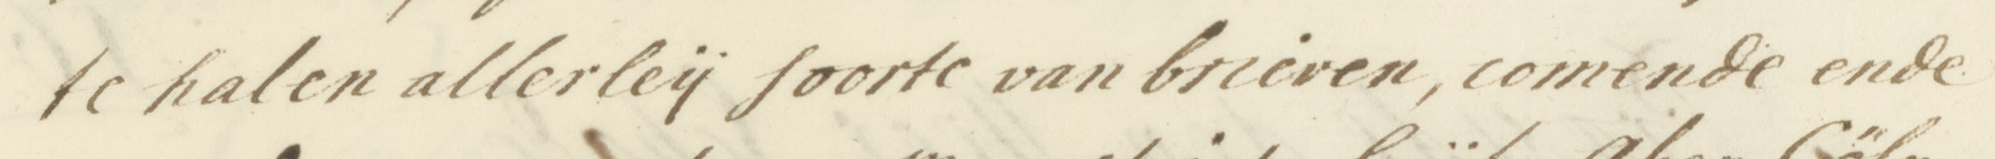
te halen allerleij soorte van brieven, comende ende
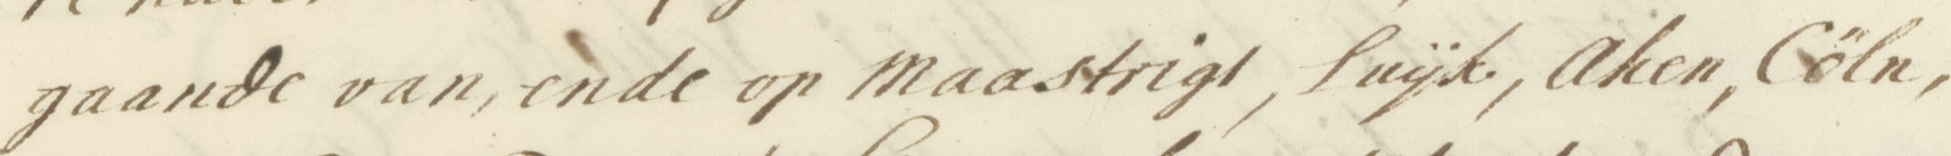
gaande van, ende op Maastrigt, Luijk, Aken, Cöln,
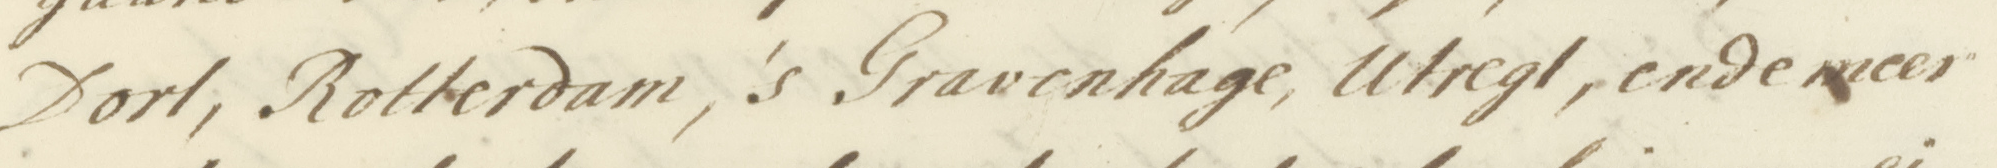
Dort, Rotterdam, 's Gravenhage, Utregt, ende meer
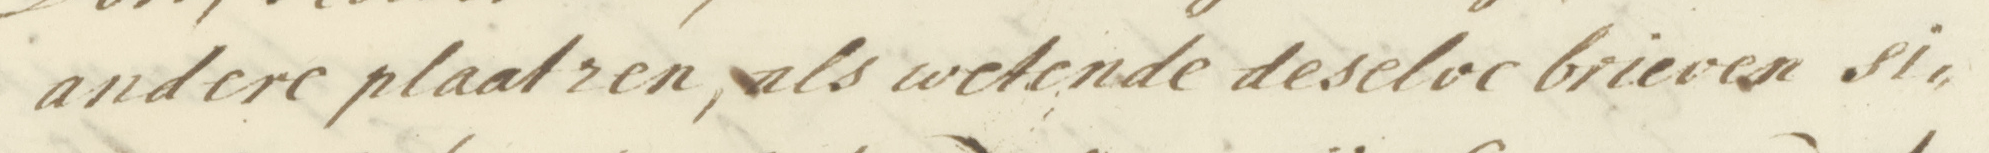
andere plaatzen, als wetende deselver brieven si„
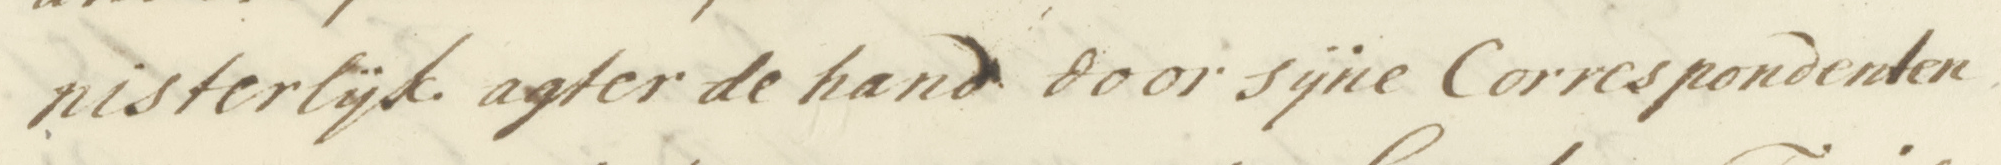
nisterlijk agter de hand door sijne correspondenten
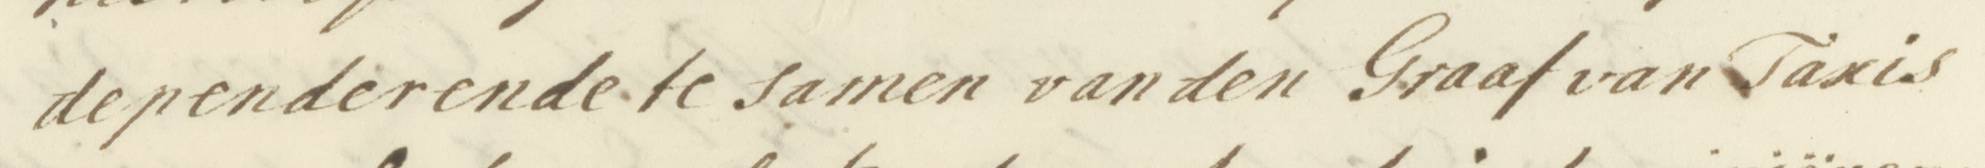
dependerende te samen vanden Graaf van Taxis
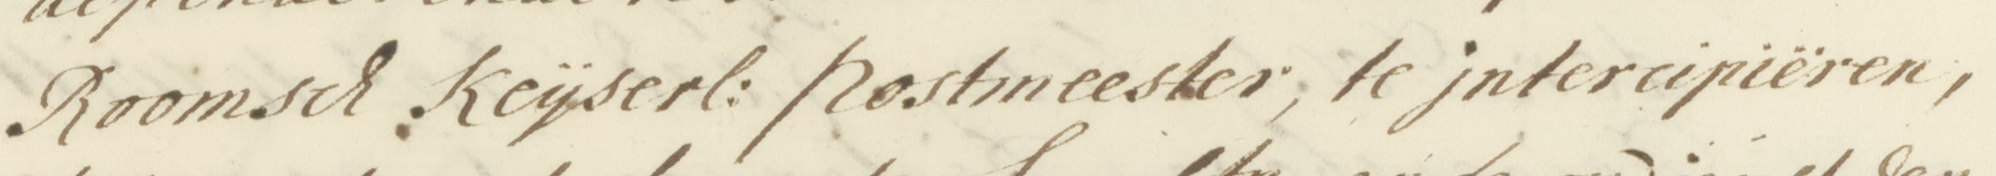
Roomsch Keijserl: postmeester, te intercipiëeren,
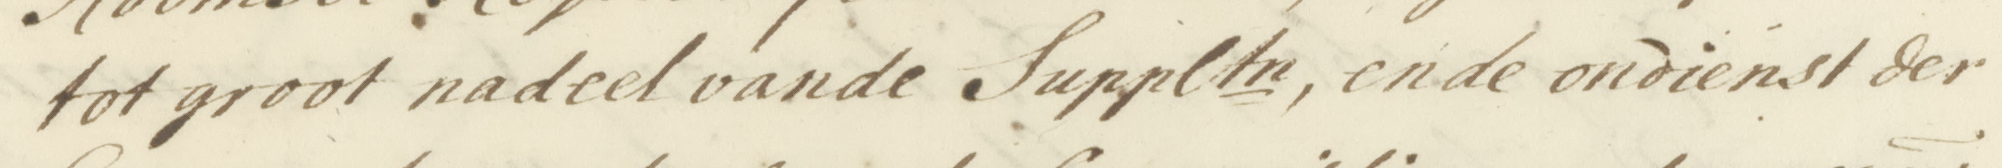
tot groot nadeel vande Suppltn., ende ondienst der
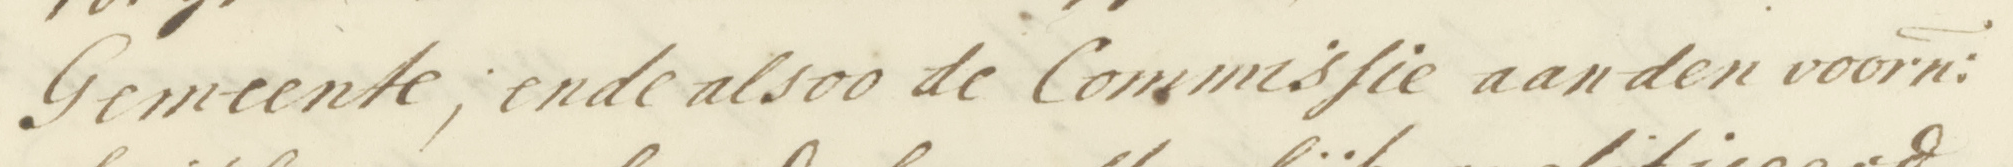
gemeente; ende alsoo de commissie aanden voorn:
